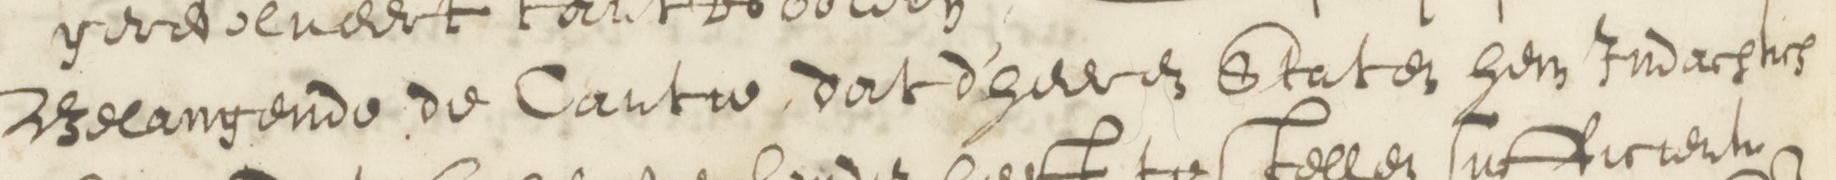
Belangende de Cautie, dat d'heeren Staten hem Indachtich
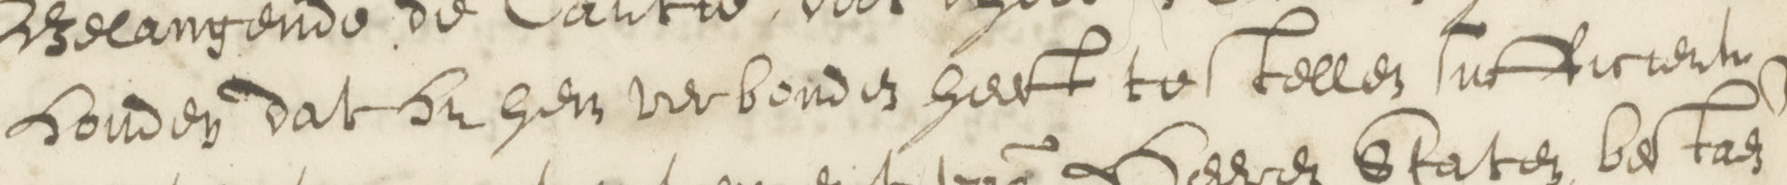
houden dat hy hem verbonden heeft te stellen sufficiente
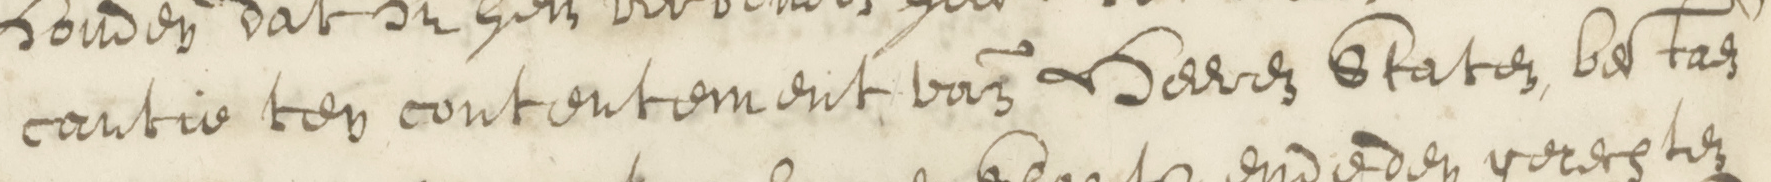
cautie ten contentement van Heeren Staten, bestaen
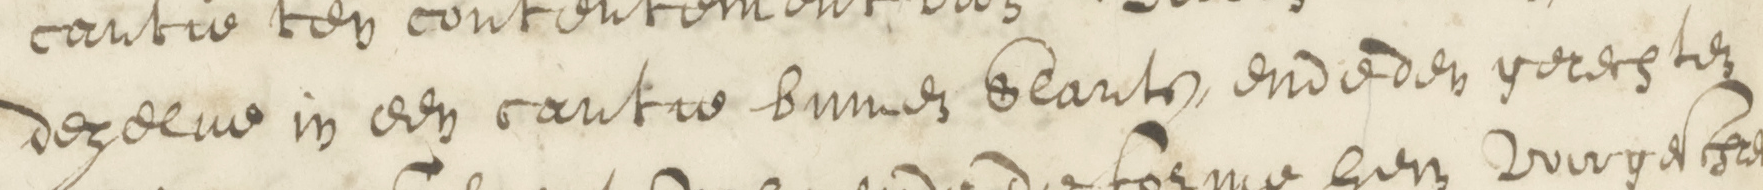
dezelve in een cautie binnen slants, ende den gerechten
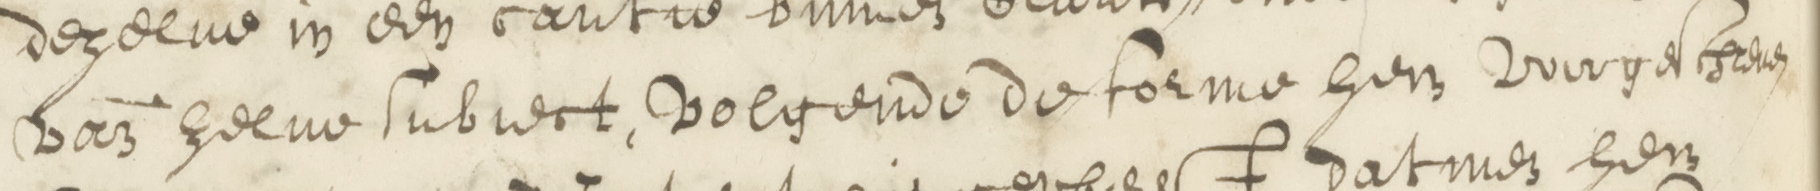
van zelve subiect, volgende de forme hem voorgeschreven
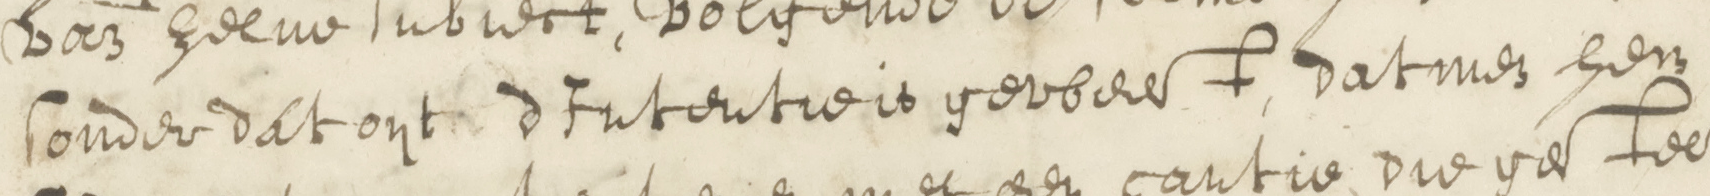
sonder dat oyt dIntentie is geweest, datmen hem
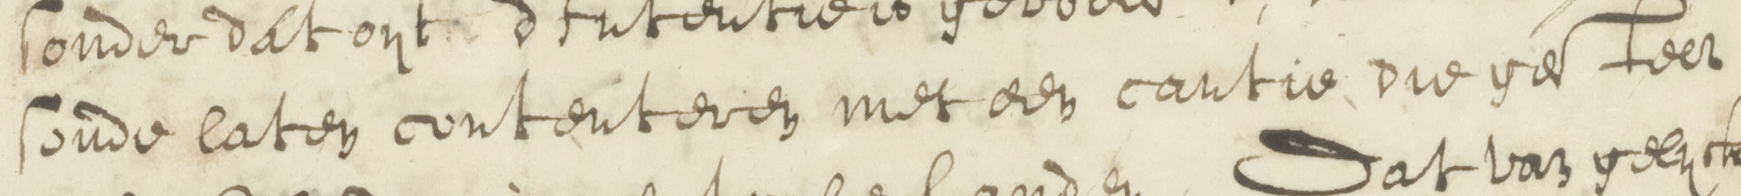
soude laten contenteren met een cautie die gestelt
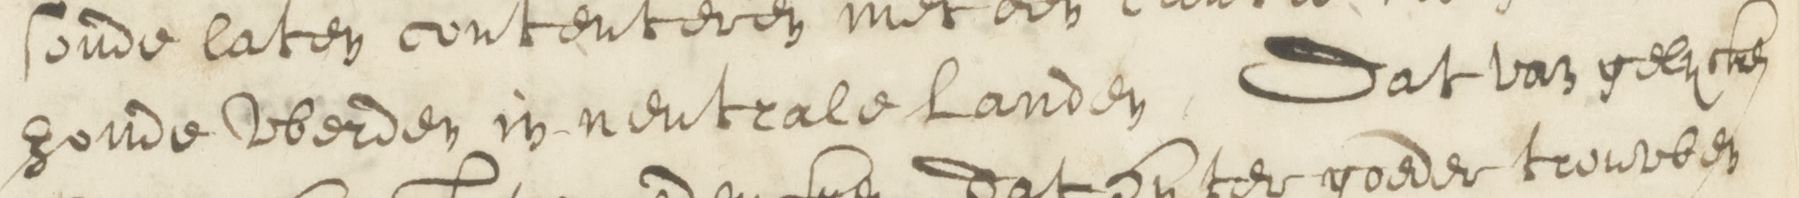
zoude werden in neutrale landen. Dat van gelycken
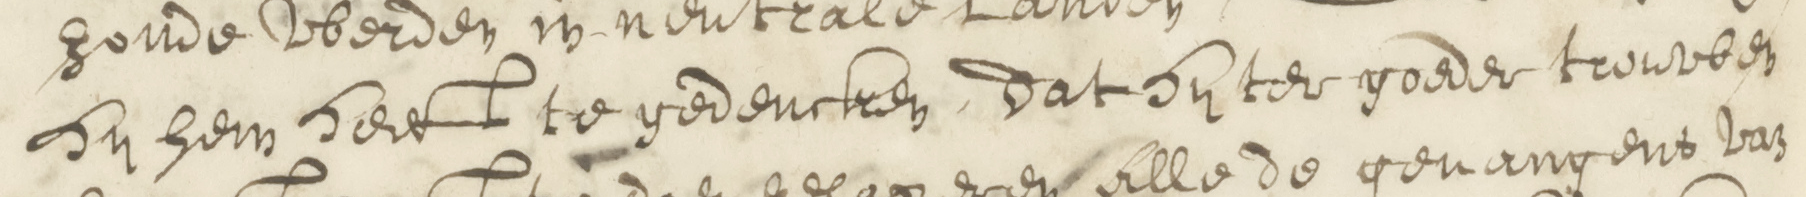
hy hem heeft te gedencken, dat hy ter goeder trouwen
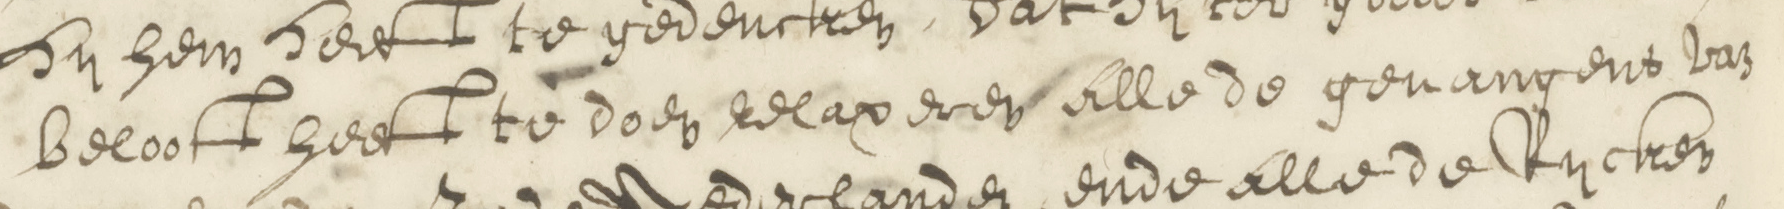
belooft heeft te doen relaxeren alle de geuangens van
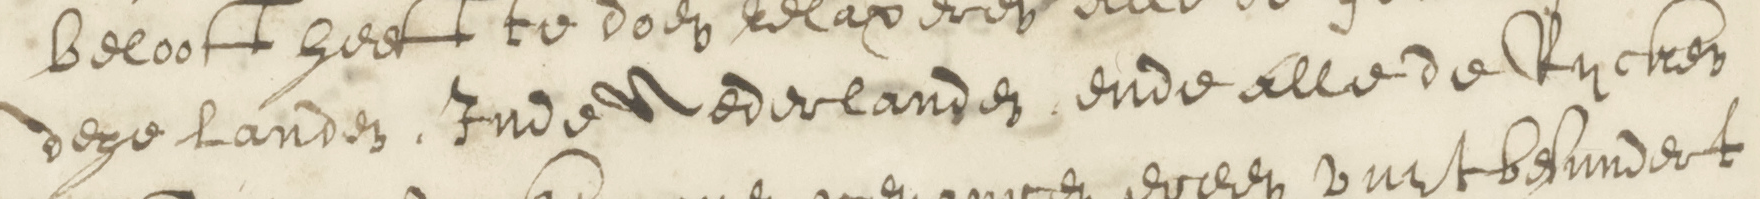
deze landen, Inde Nederlanden, ende alle de Rycken
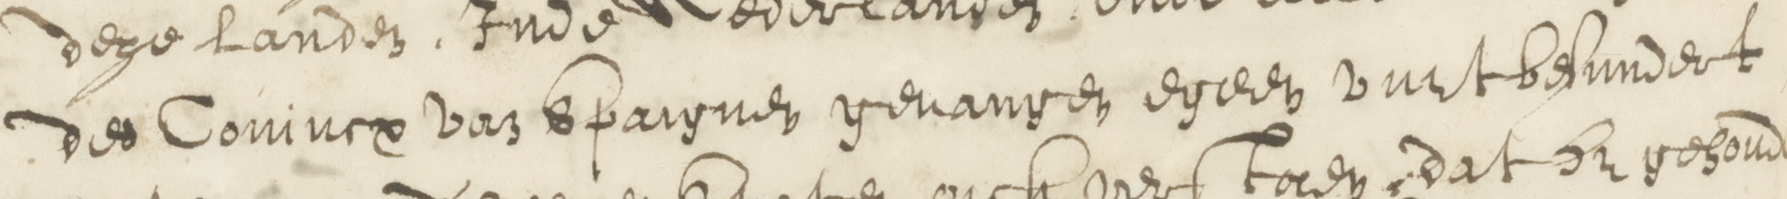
des Conincx van Spaignen geuangen egeen vuytbesundert
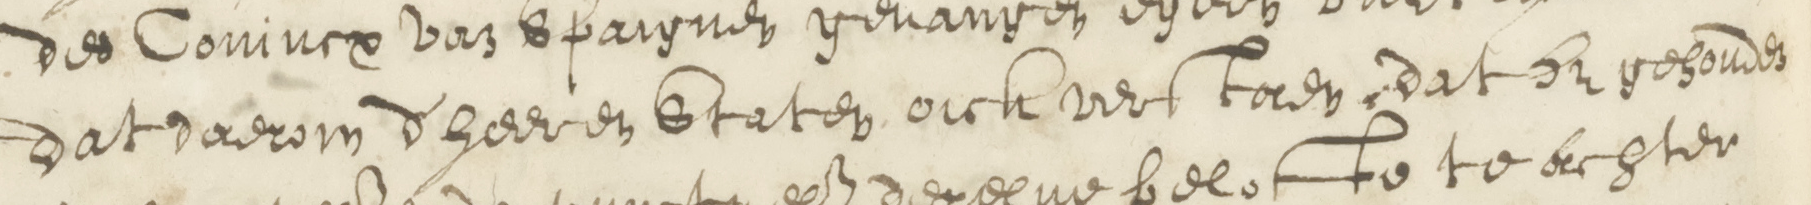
dat daerom d'heeren Staten oick verstaen, dat hy gehouden
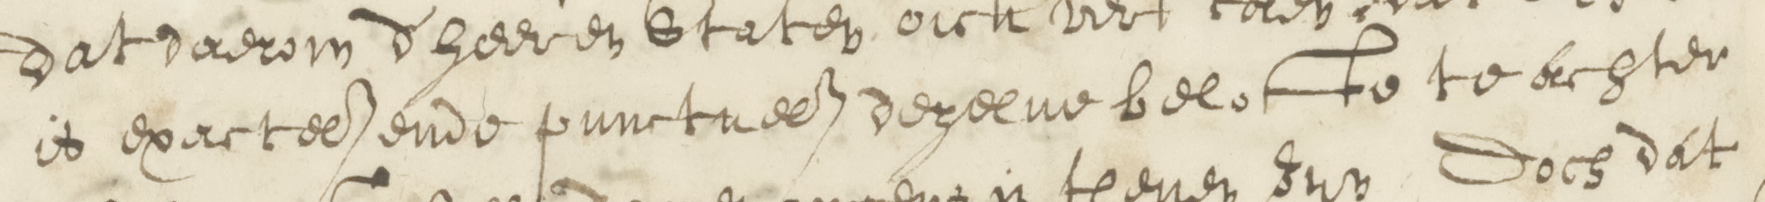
is exactel ende punctuel dezelve belofte te achter
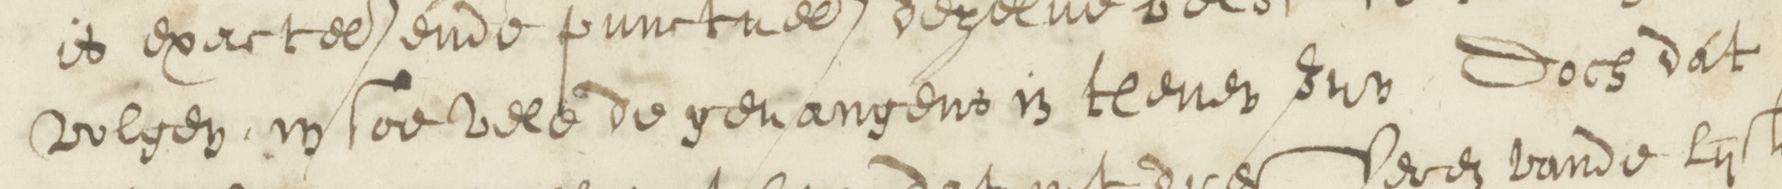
volgen, in soe vele de gevangens in tleuen zyn doch dat
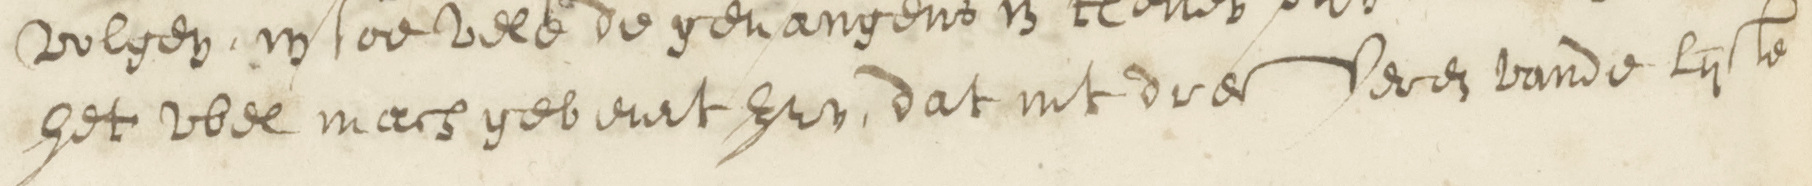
het wel mach gebeurt zyn, dat int dresseren vande lyste
